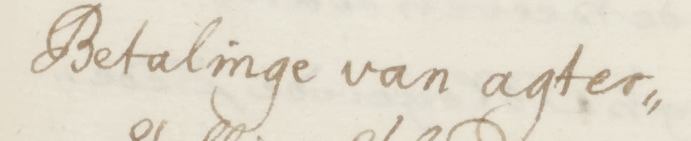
Betalinge van agter„
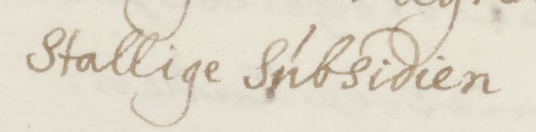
stallige subsidien
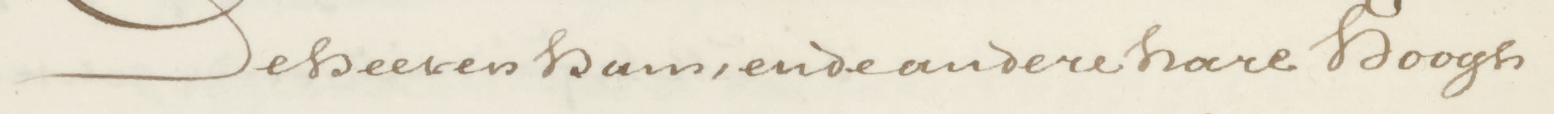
De heeren Ham, ende andere hare Hoogh
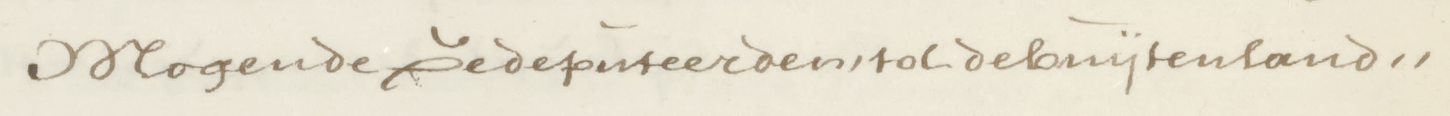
Mogende Gedeputeerden, tot de buijtenland,
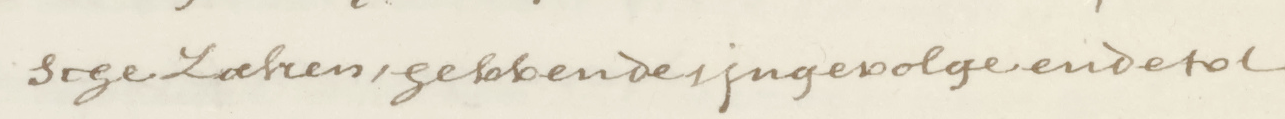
sche zaken, hebbende, ingevolge ende tot
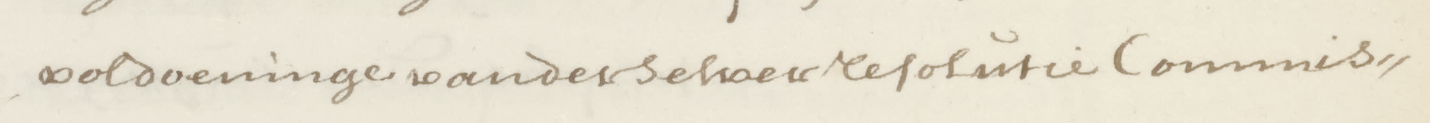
voldoeninge van derselver resolutie Commis„
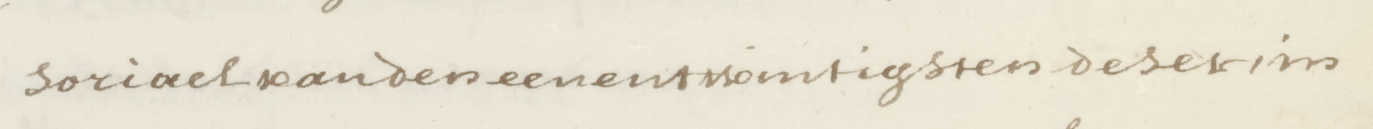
soriael vanden eenentwintigsten deser, in
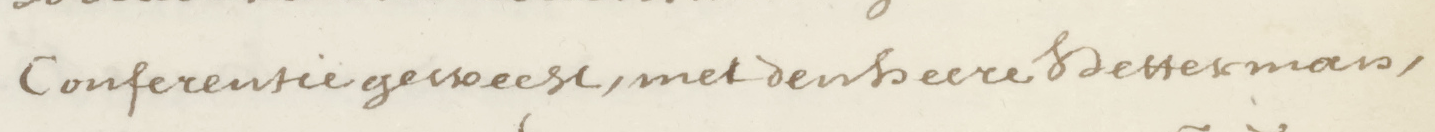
conferentie geweest, met den heere Hetterman,
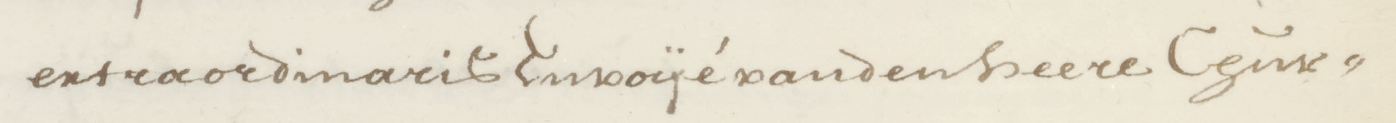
extraordinaris Envoijé vanden heere Chur„
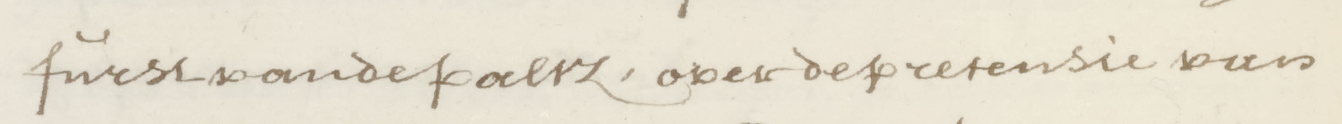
furst vande paltz, over de pretensie van
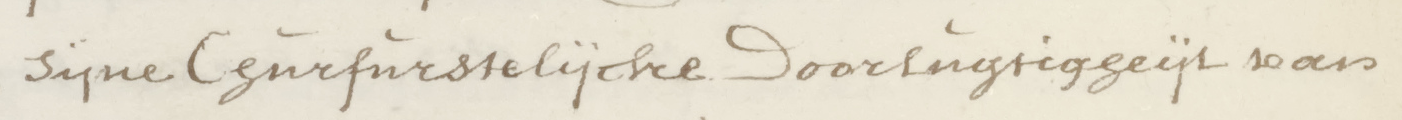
sjne Churfurstelijcke Doorlugtigheijt van
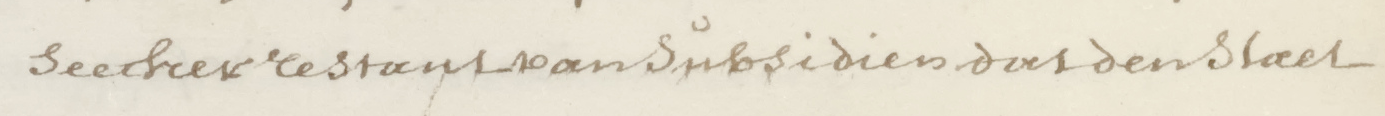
seecker restant van subsidien dat den Staet
